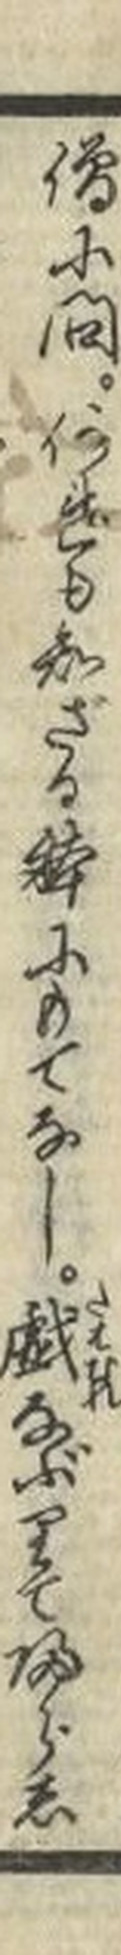僧に問。何れも知ざる体にもてなし。戯なぶりて帰らし
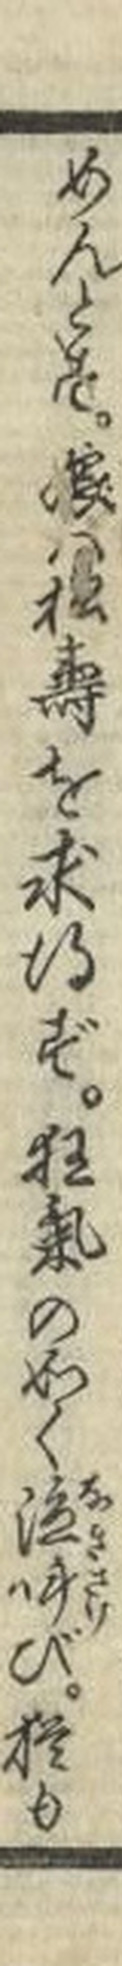めんとす。娘は松寿を求得ず。狂気の如く泣叫び。猶も
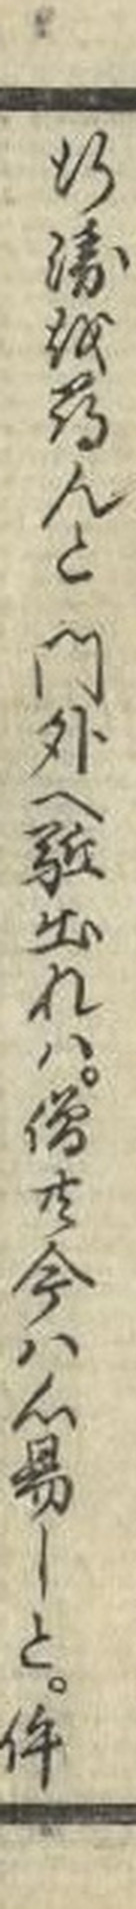行衛を尋んと門外へ駈出れは。僧共今は心易しと。件
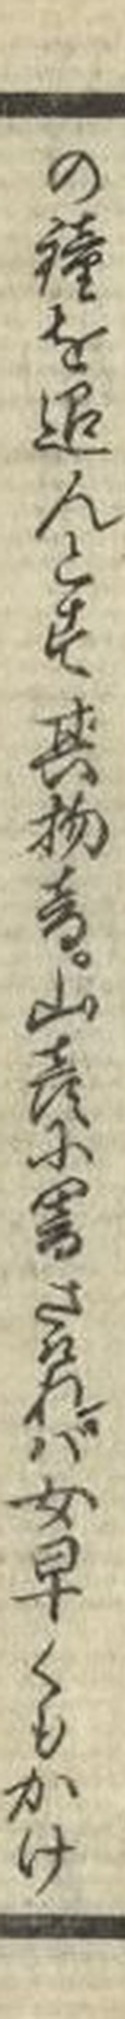の鐘を退んとす其物音。山彦に響さければ女早くもかけ
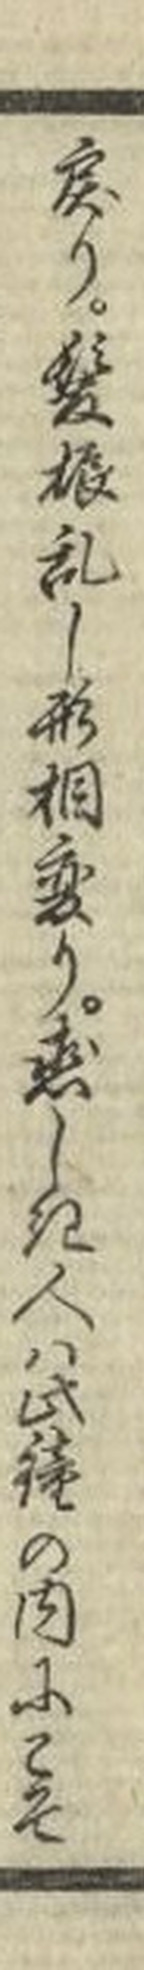戻り。髪振乱し形相変り。恋しき人は此鐘の内にこそ
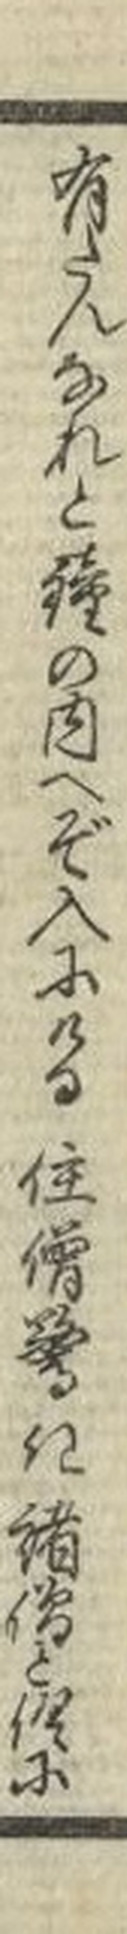有たんなれと鐘の内へぞ入にける住僧驚き諸僧と倶に
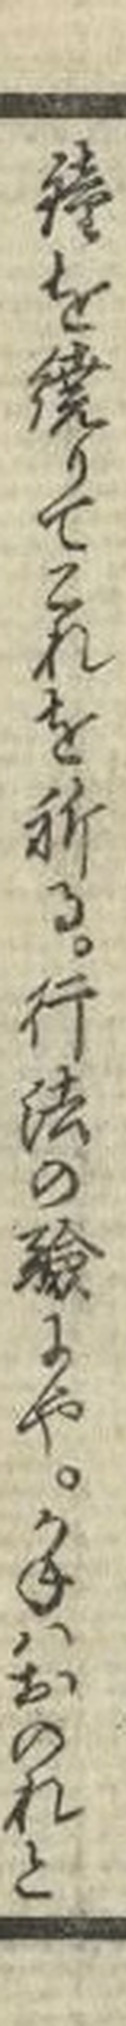鐘を繞りてこれを祈る。行法の験にや。かねはおのれと
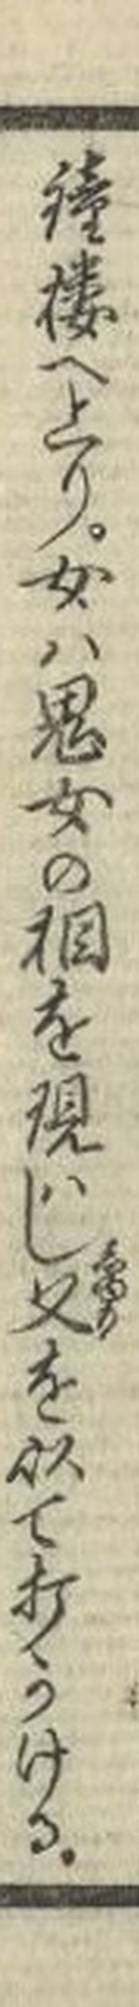鐘楼へ上り。女は鬼女の相を現はしを以て打かける。
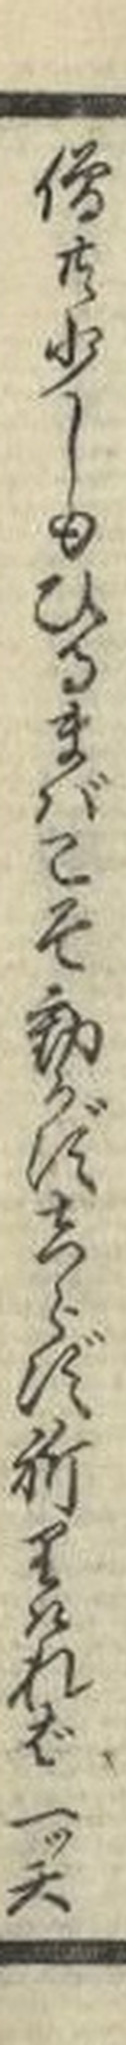僧共少しもひるまばこそ動かず去らず祈りければ一ッ天
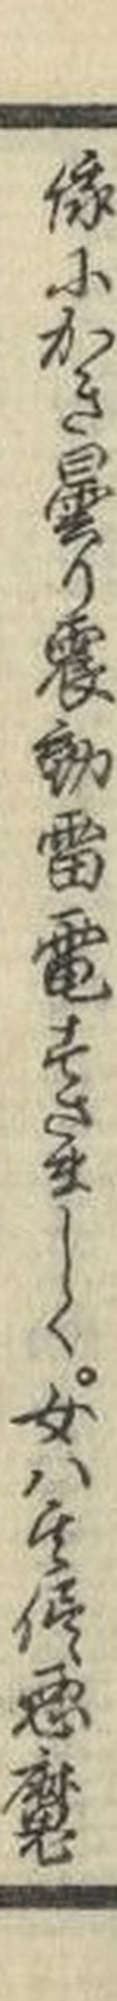俄にかき曇り震動雷電すさましく。女は其儘悪魔
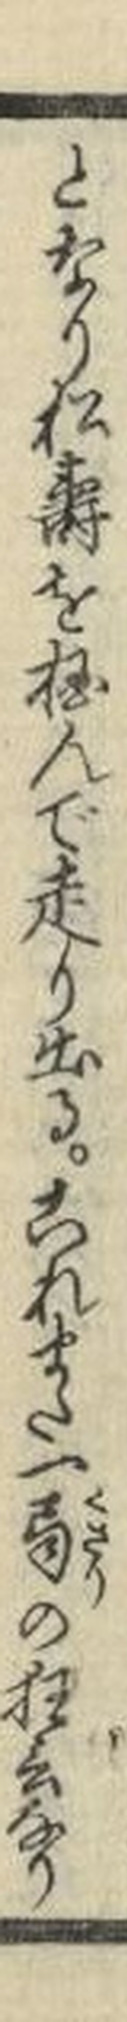となり松寿を掴んで走り出る。これまた一局の狂言なり
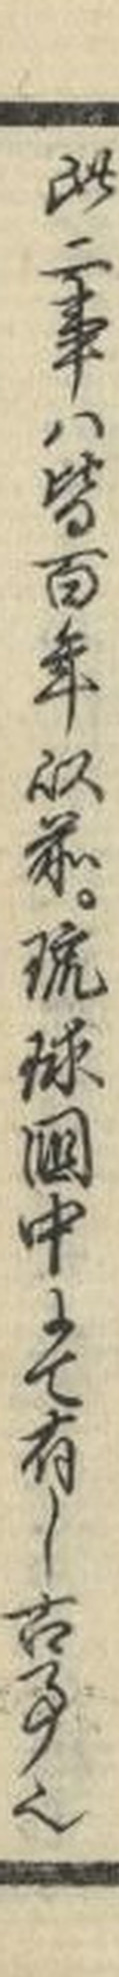此二事は皆百年以前。琉球国中にて有し古事也
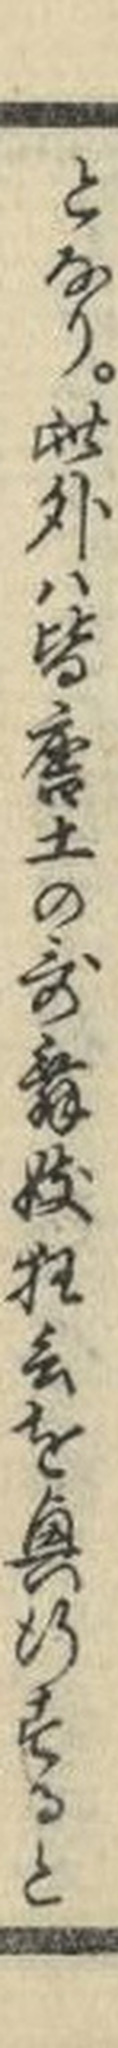となり。此外は皆唐土の哥舞妓狂言を興行すると
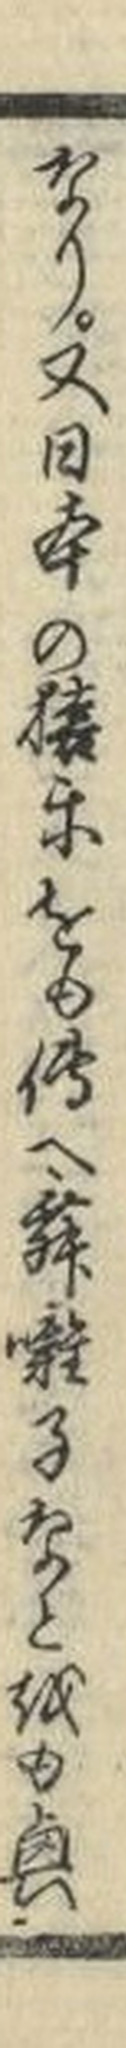なり。又日本の猿楽をも伝へ舞囃子なとをも興
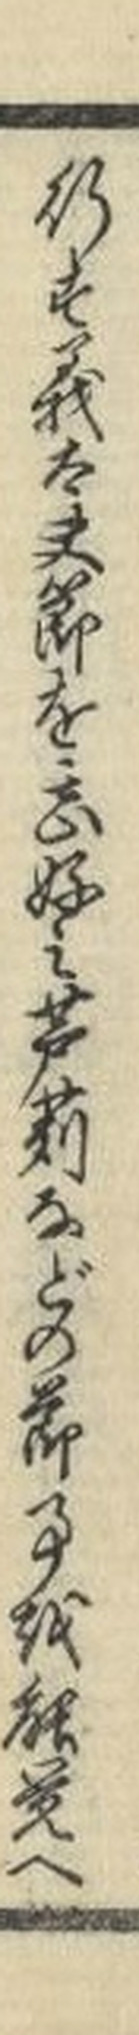行す義太夫節を甚好み芦刈などの節事を能覚へ
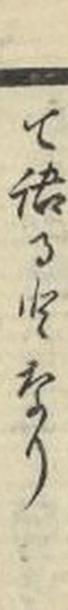て語るとなり
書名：琉球解語
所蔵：University of the Ryukyus Library
